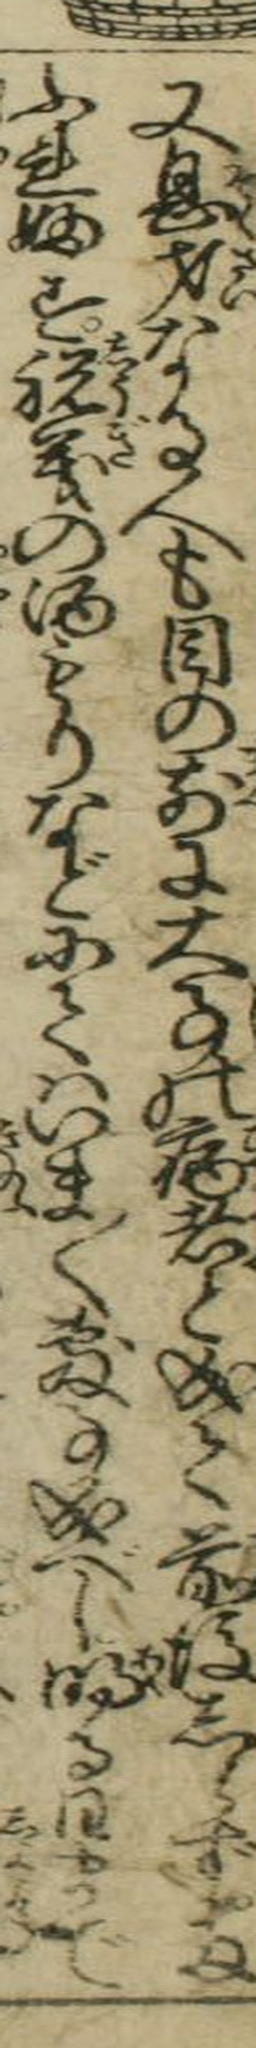ふれふす。祝儀の酒もりなどにてはいま〳〵敷事成べし明る日まで
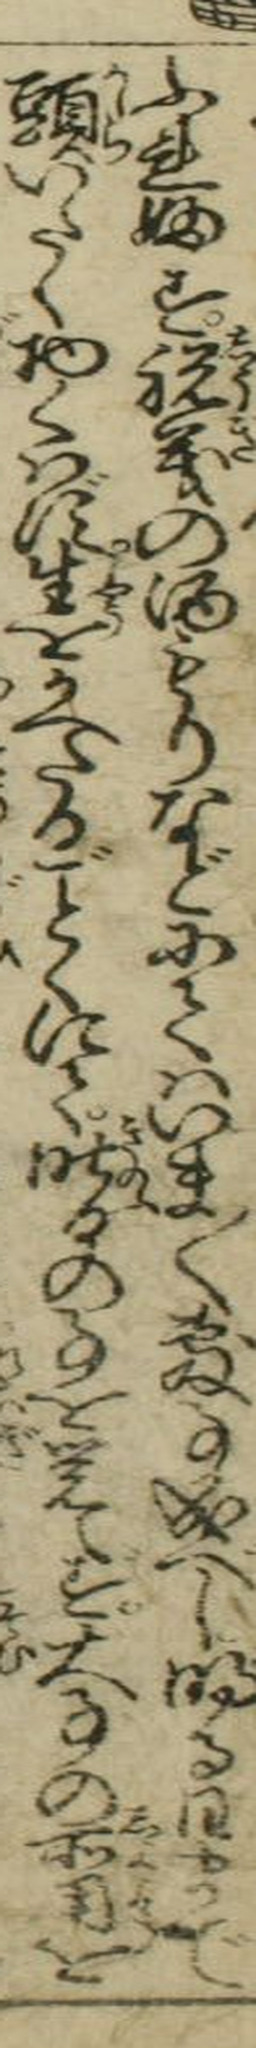頭いたく物くはず。生をかへたるごとくにて。昨日の事を覚えず。大事の所用を
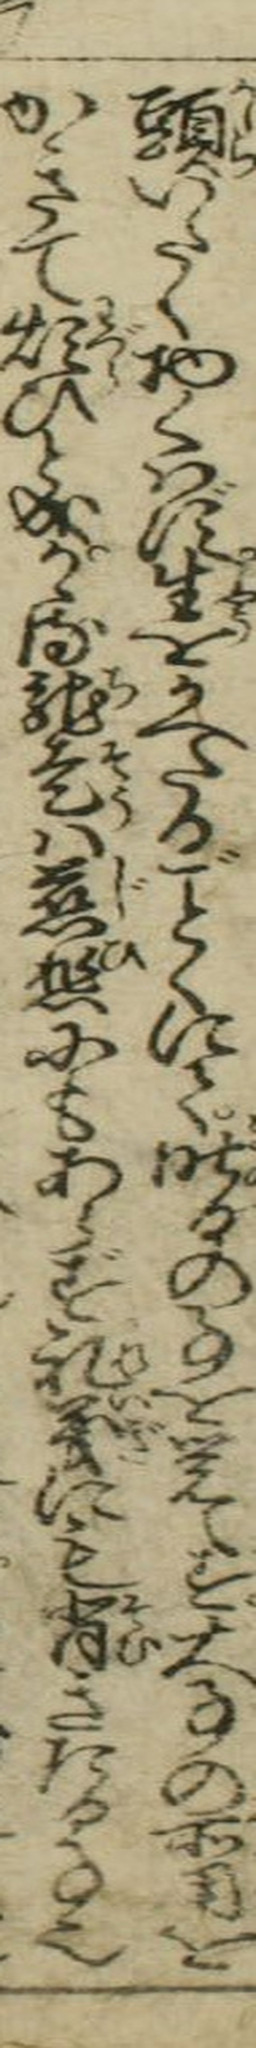かきて煩ひと成。かゝる馳走は慈悲にもあらず礼儀にも背きたる事也
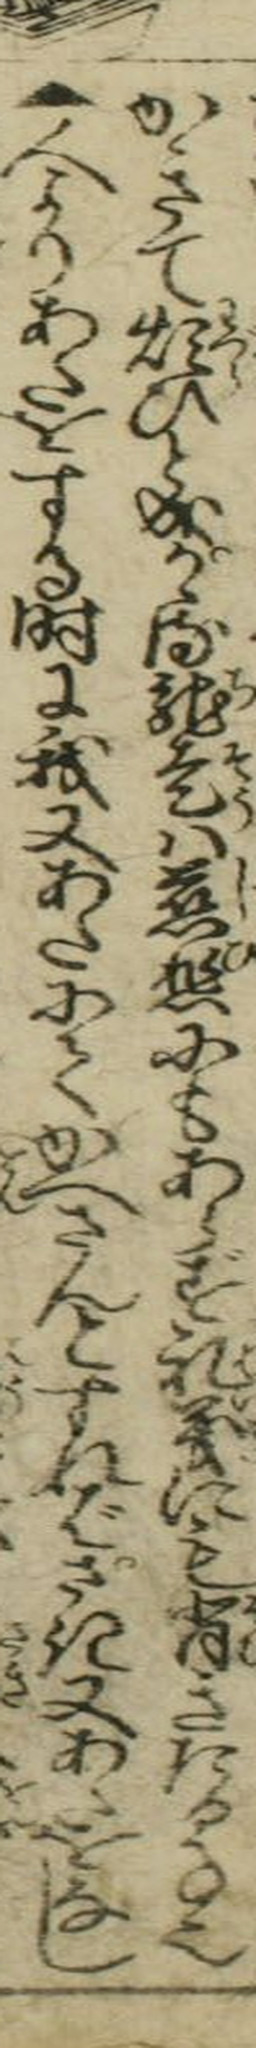▲人よりあたをする時に我又あたにてかへさんとすれば。さき又あたをなし
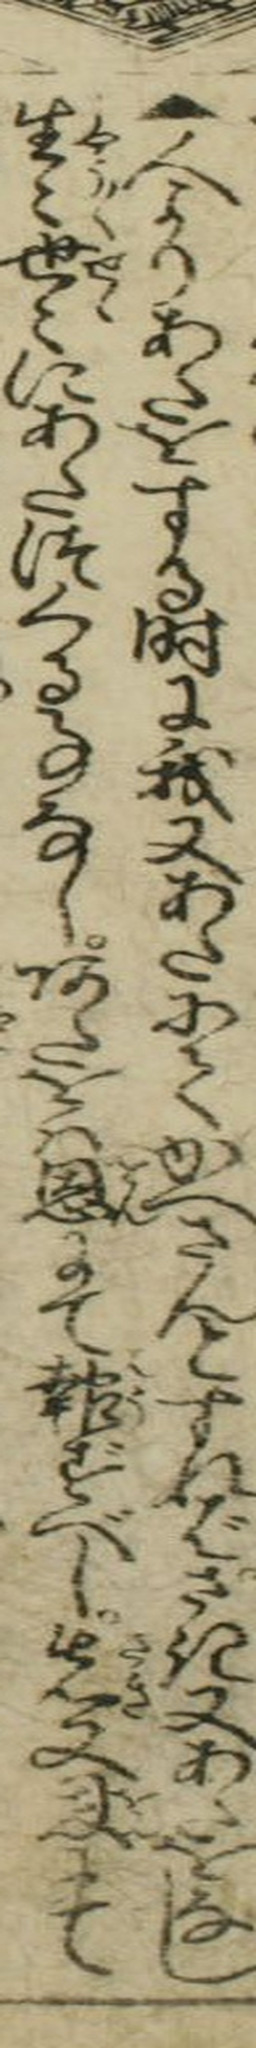生〻世〻にあたつくる事なし。あたをは恩にて報ずべし。先又恩にて
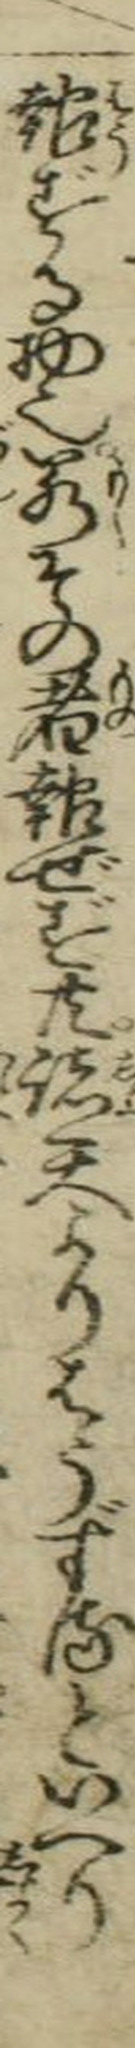報ずる物也。若その者報ぜず共。諸天よりはうずるといへり
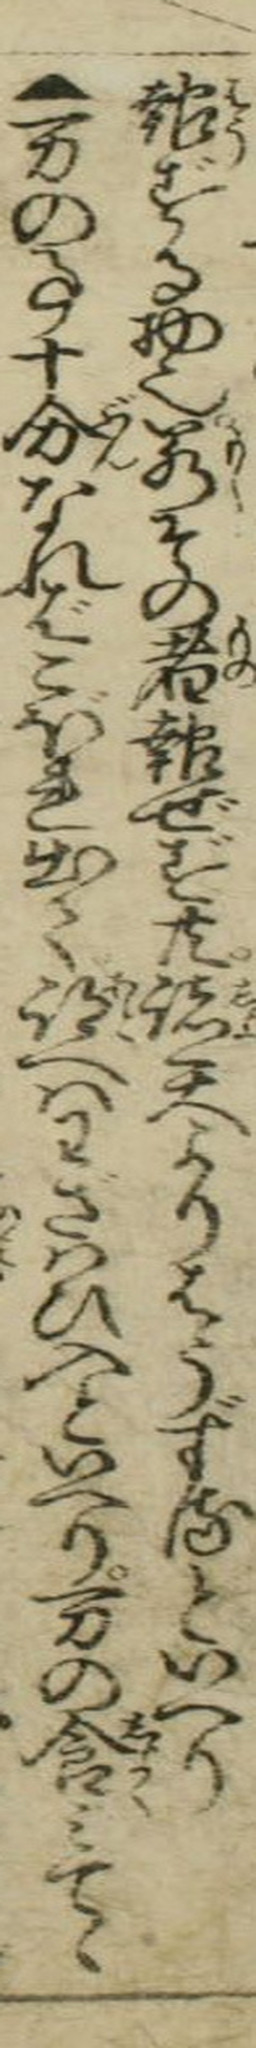▲万の事十分なればこぼれ出て跡へわざはひ入といへり。万の食みてゝ
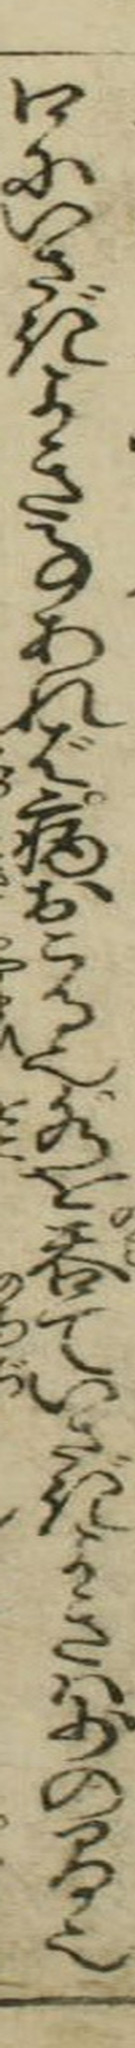口にいさぎよき事あれば病おこる也。水を呑ていさぎよきは少の間也
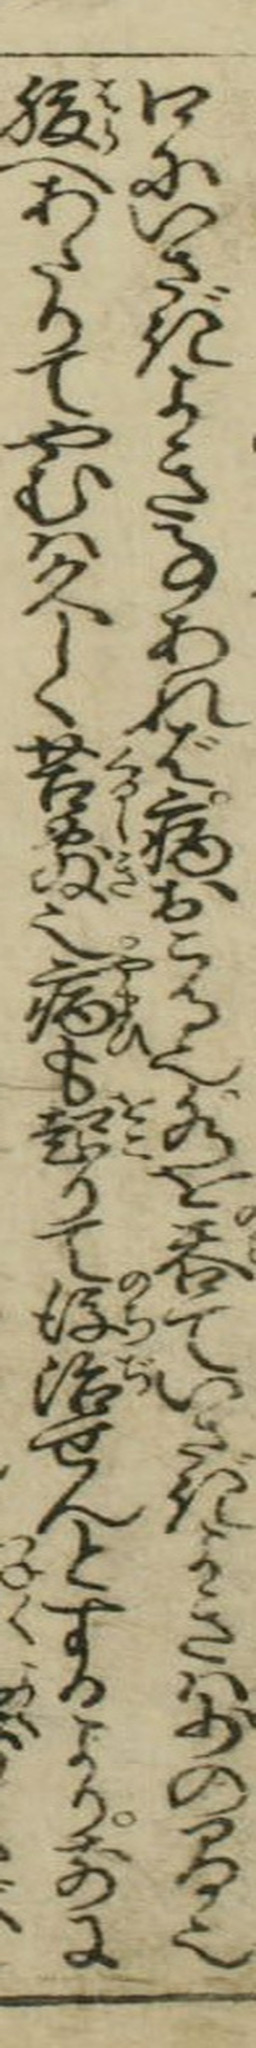腹へあたりてやむは久しく苦敷也。病も起りて後治せんとするより。前に
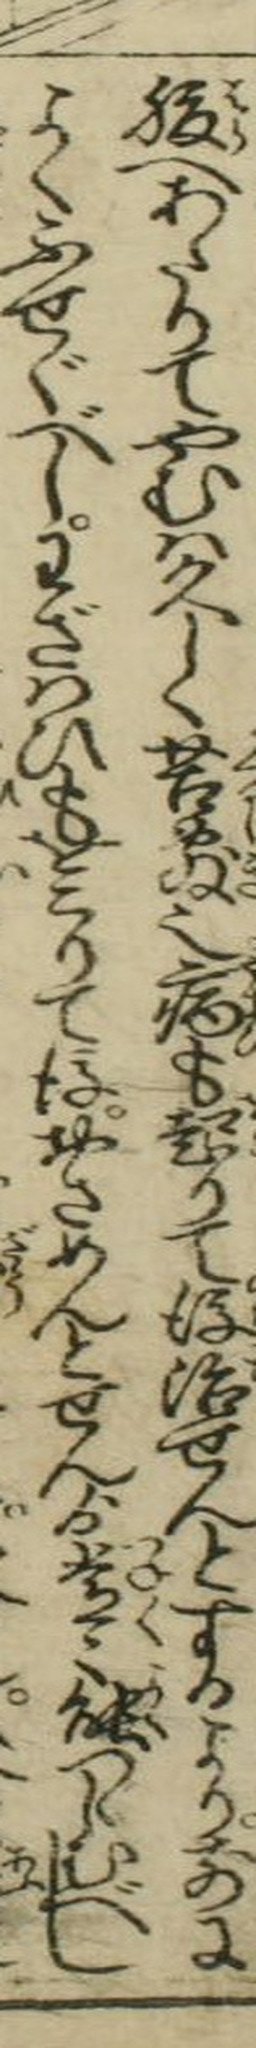よくふせぐべし。わざはひもをこりて後。おさめんとせんより常〻能つゝしむべし
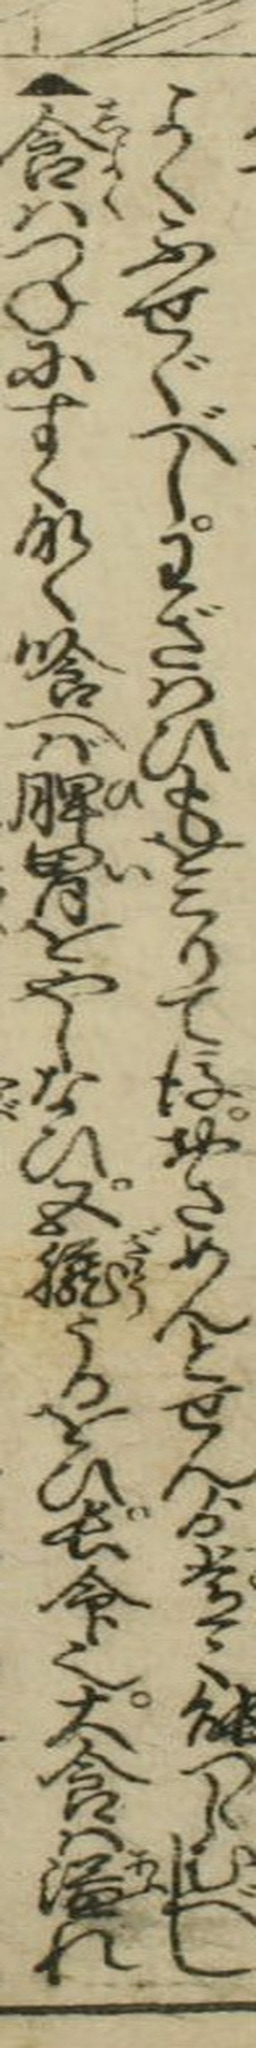▲食はつねに少なく喰えば脾胃をやしなひ。五臓うるをひ。長命也。大食は溢れ
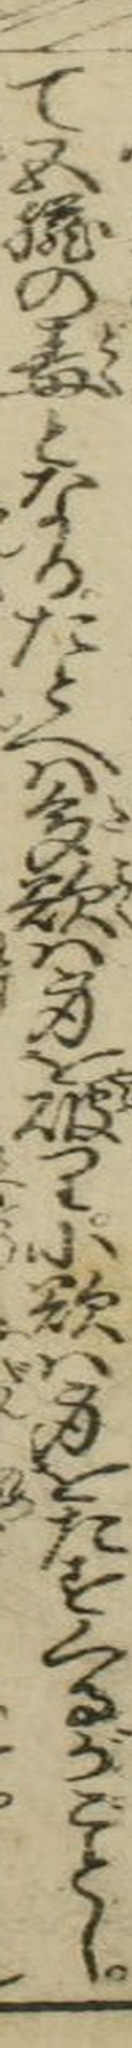て五臓の毒となる。たとへは多欲は身を破り。小欲は身をたすくるがごとし。
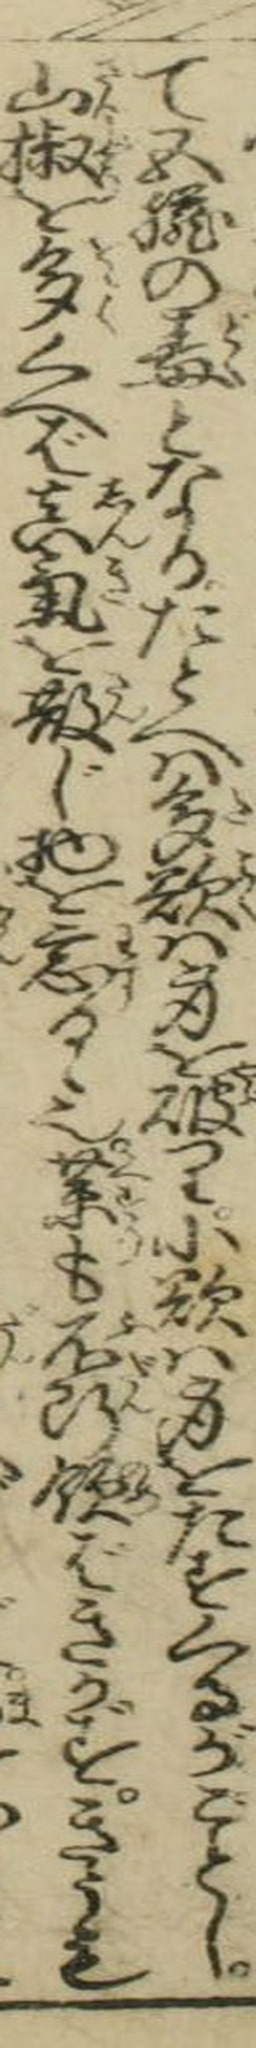山椒を多くへば真氣を散じ物を忘るゝ也。薬も不断飲ばきかず。きうも
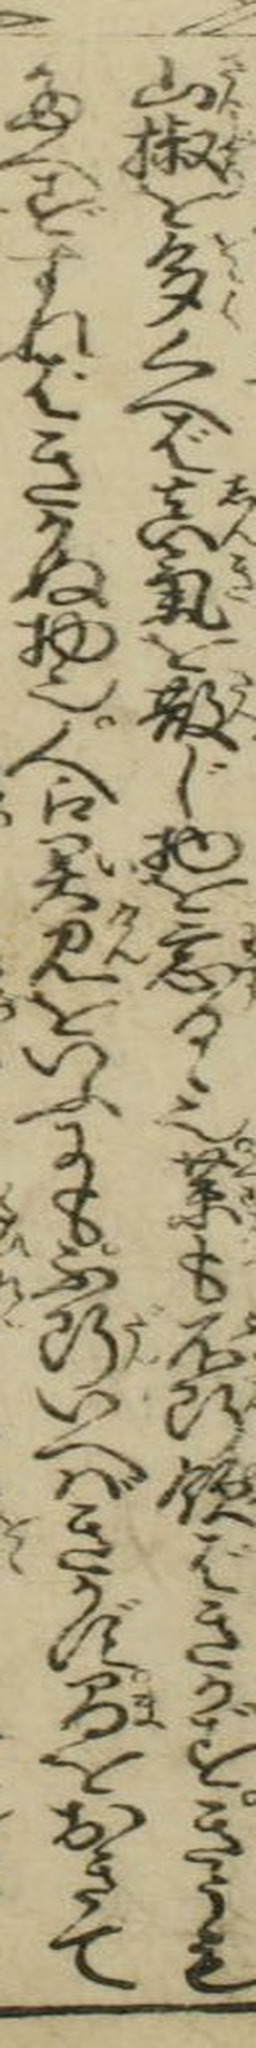たへずすればきかぬ物也。人え異見をいふにも。不断いへばきかず。間をおきて
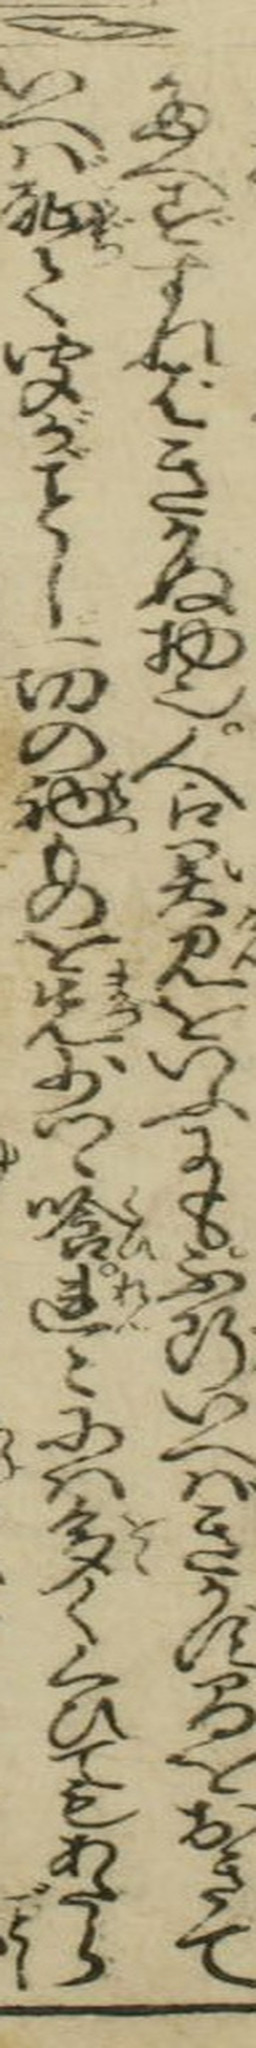いへば恥て聞くがごとし一切の初ものを先少つゝ喰。連とには多くくひてもあたら
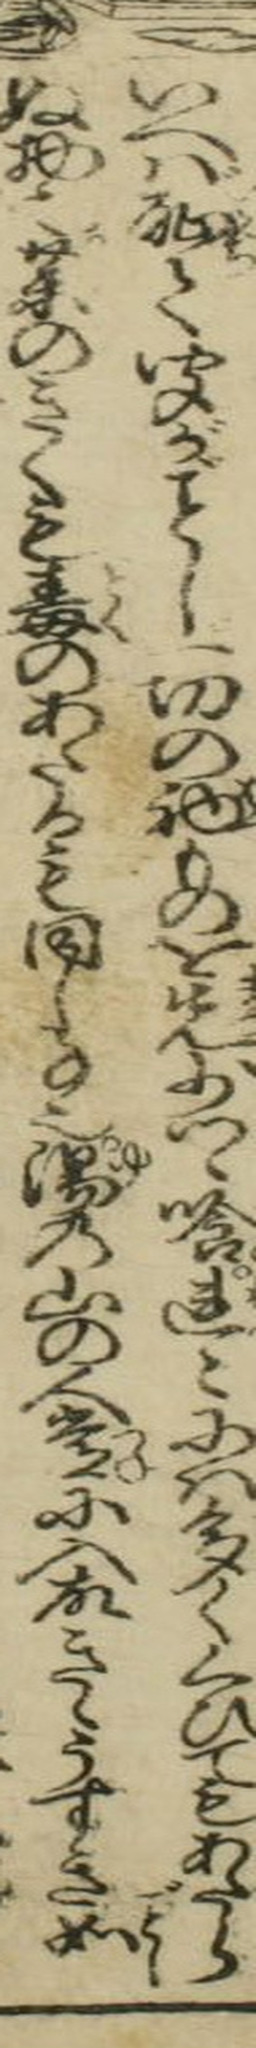ぬ物也。薬のきくも毒のあたるも同じ事也。湯の山の人常に入故きゝうすき如
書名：女源氏教訓鑑
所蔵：東京学芸大学附属図書館
